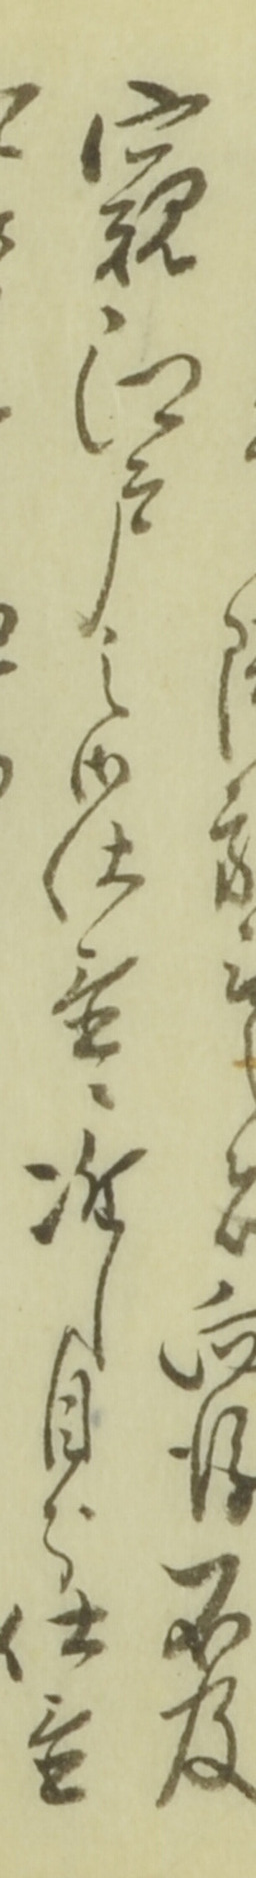窺江戸之御仕置ニ准し自分仕置
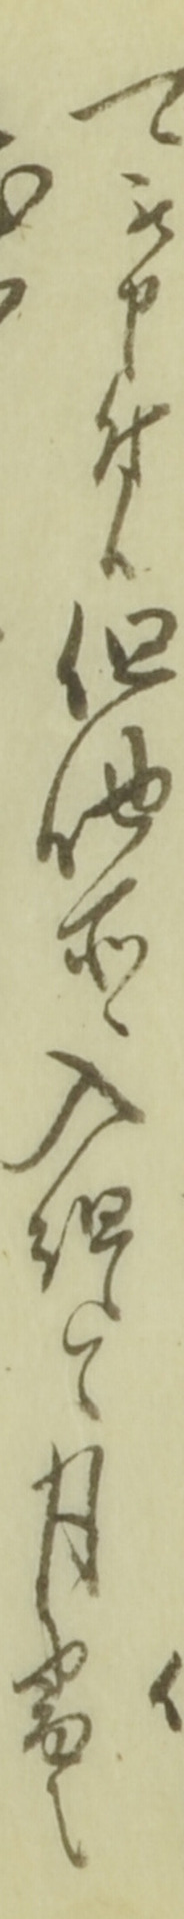可被申付候但他所へ入組候ハヽ月番之
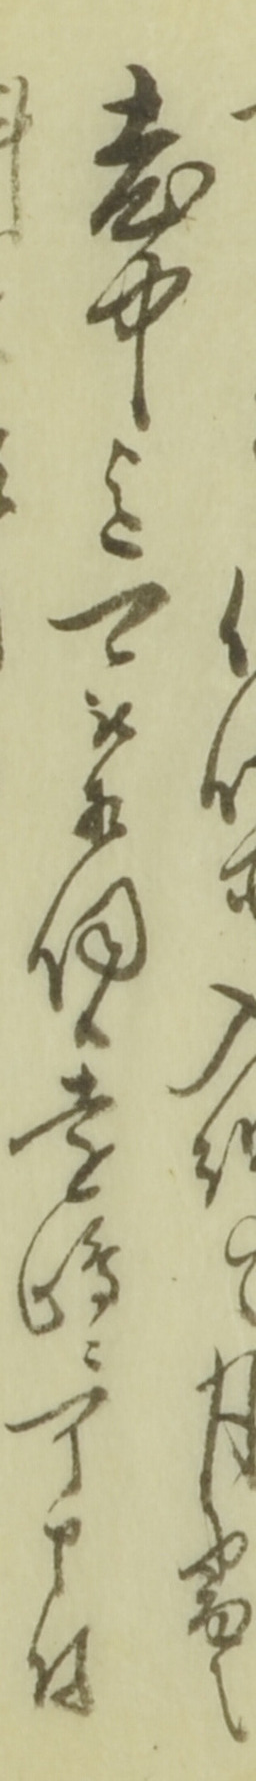老中迄可被相伺候遠嶋ニ可申付
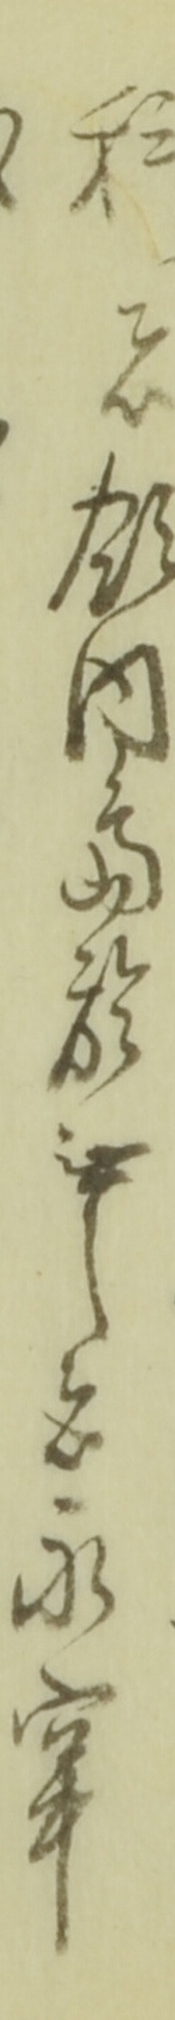科者領内島於無之者永牢
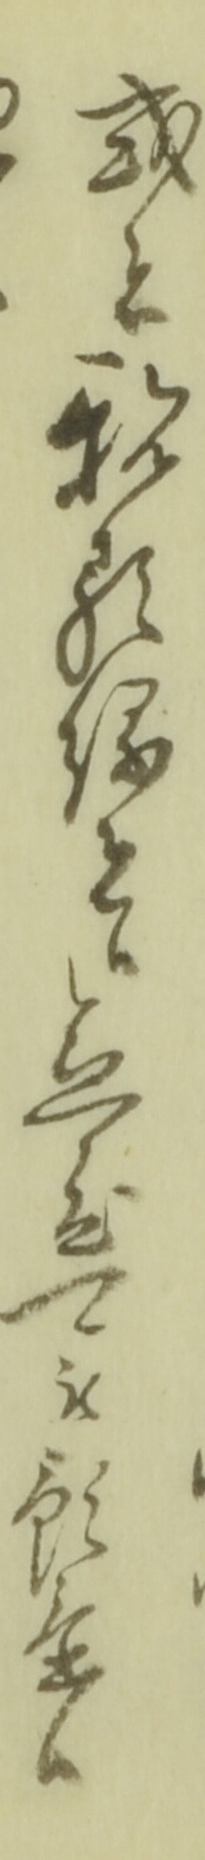或者親類縁者江急度可被預置候
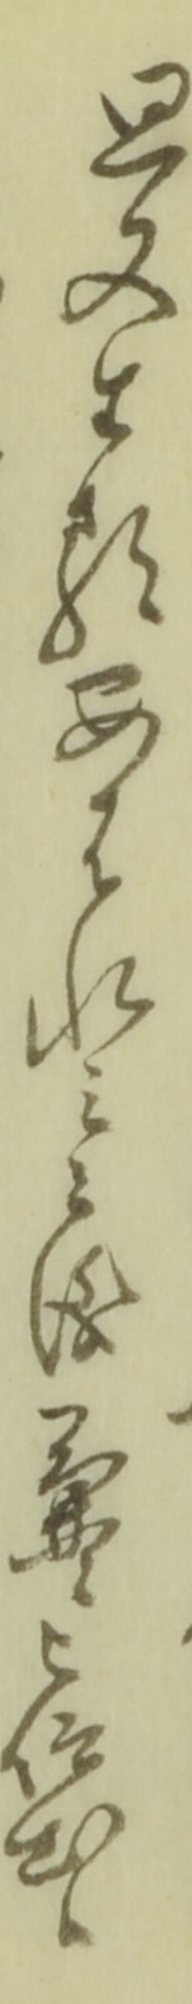且又生類あはれみ之儀兼々被仰出候
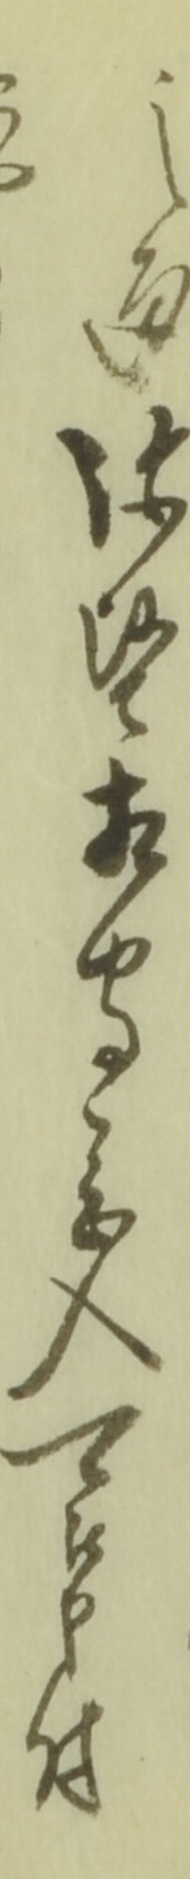之通弥堅相守念入可被申付
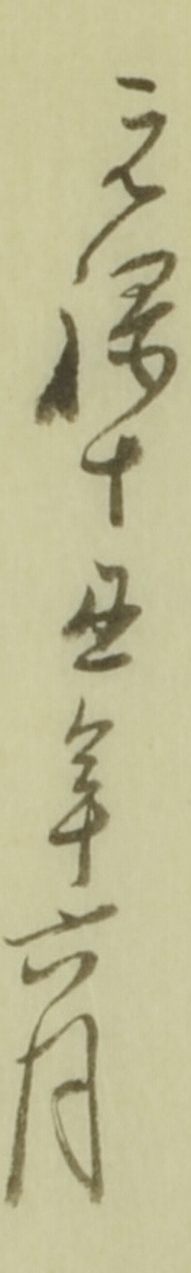元禄十年丑年六月
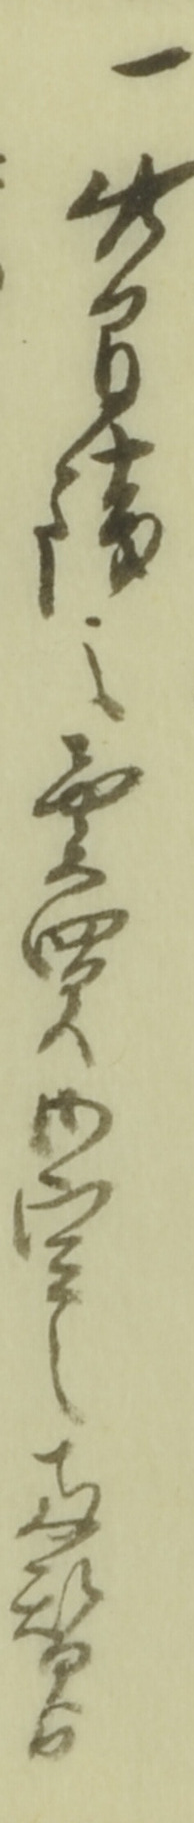一此間銭之売買御定之両替ゟ
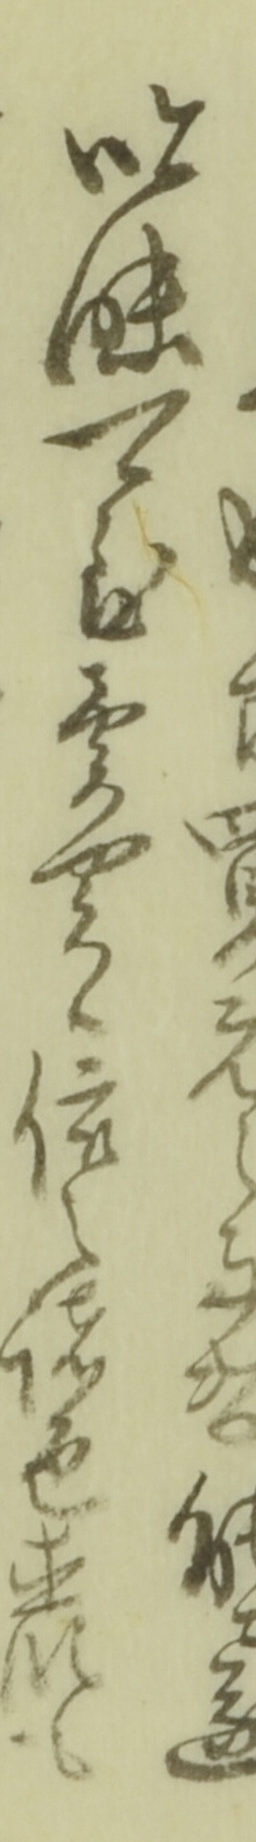吟味可致売買候依之諸色直段も
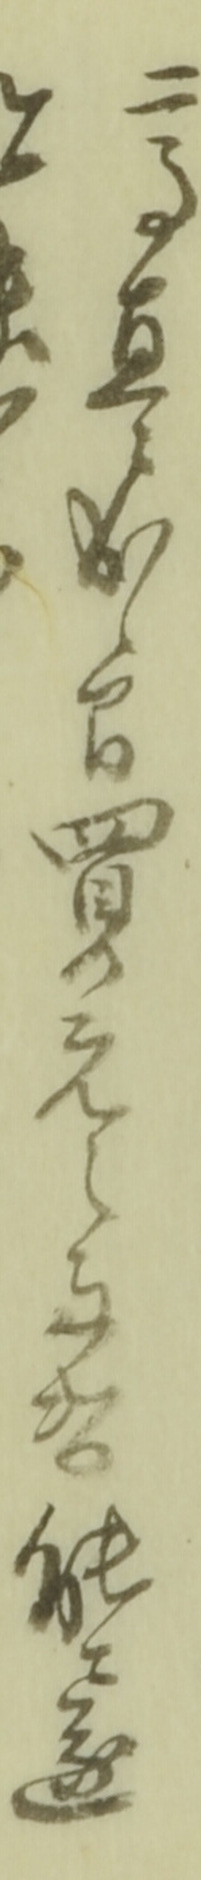高直ニ成候間買元之両替能々遂
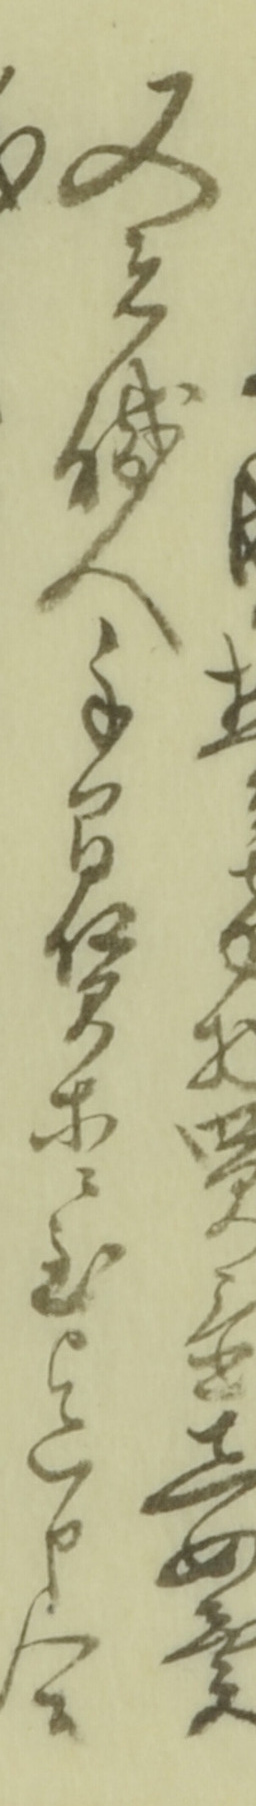又者職人手間賃等ニ至迄申合
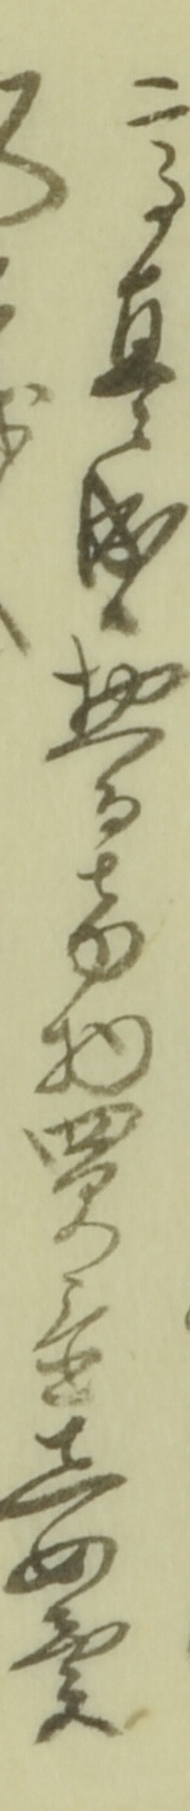高直ニ成候惣而商物買置しめ売
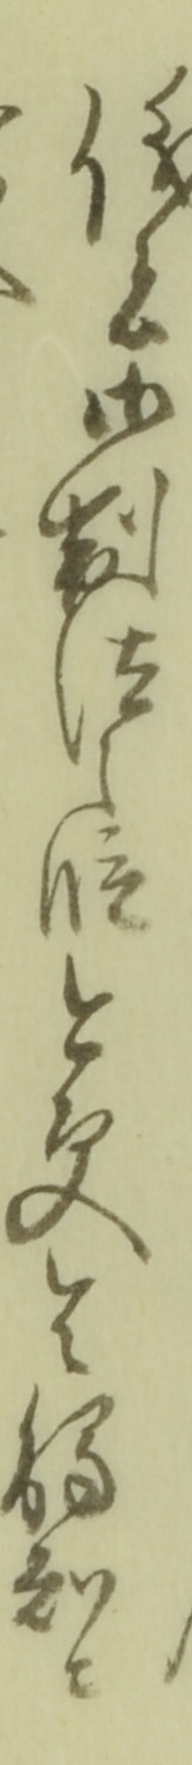儀者御制法之段今更令触知ニ
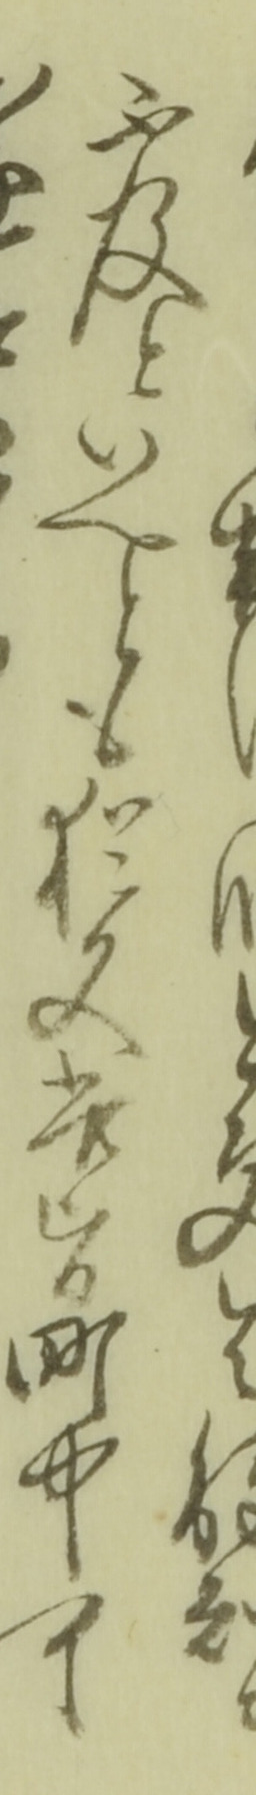不及といへども猶又此旨町中可
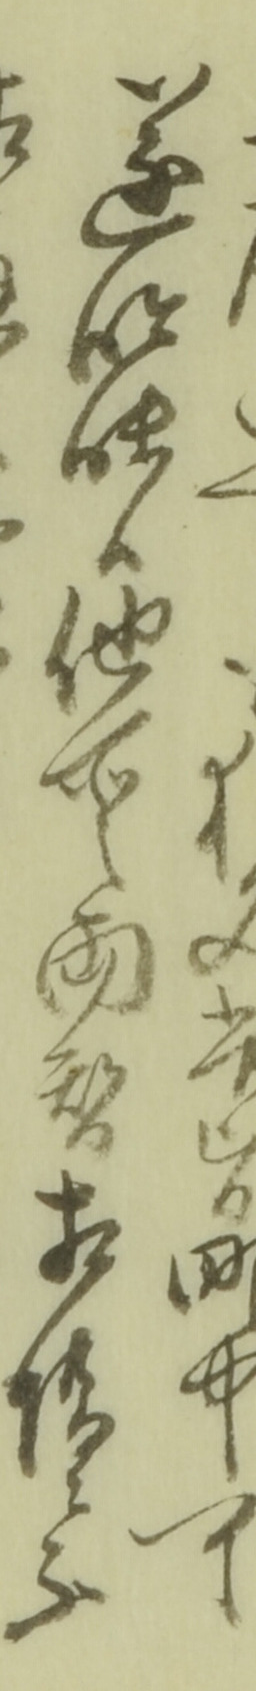遂吟味候他所之両替相場ニ不
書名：御公儀様御領主様御触書控
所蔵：伊那市立高遠町図書館・合同会社AMANE
